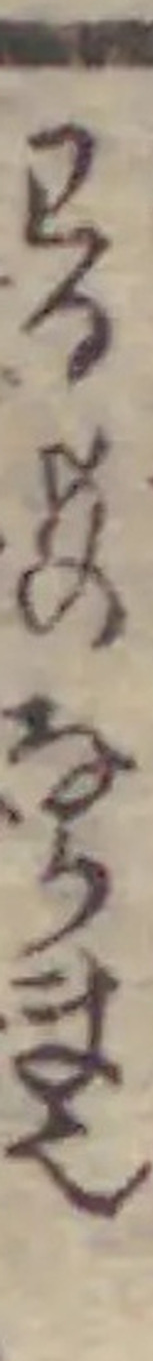わるものなかま也
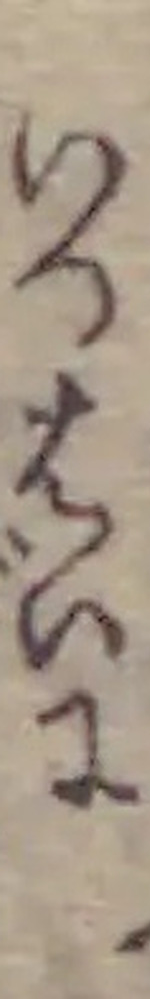いつはいに
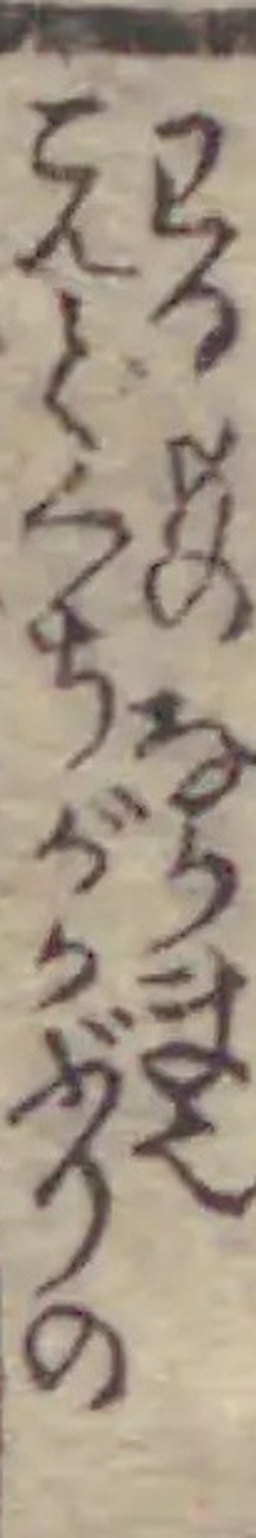こんどくちがかぶりの
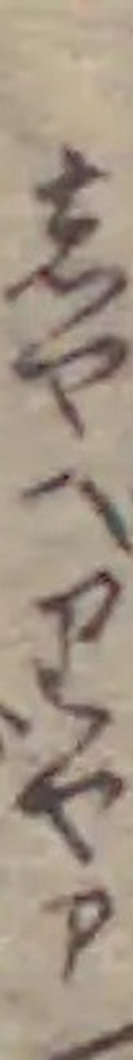しやべりやぁ
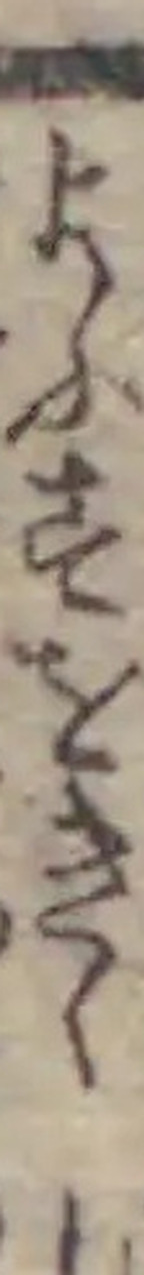よふすをきゝ
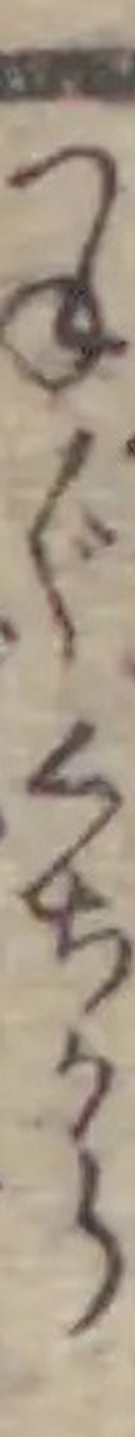つね〴〵くちから
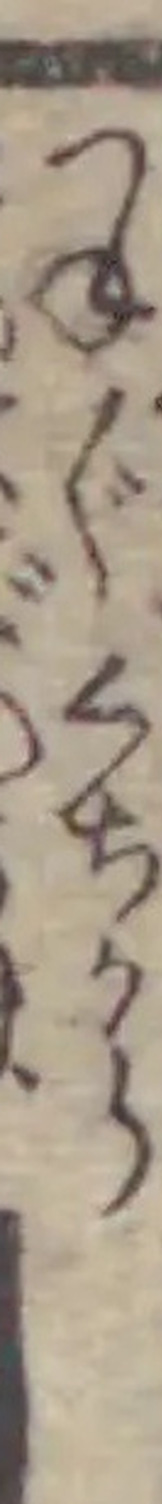つね〴〵くちから
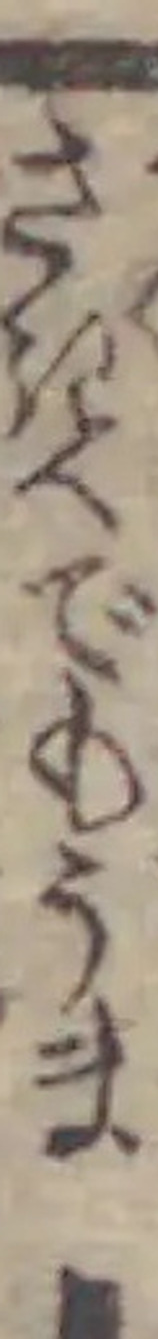さきへでもうま
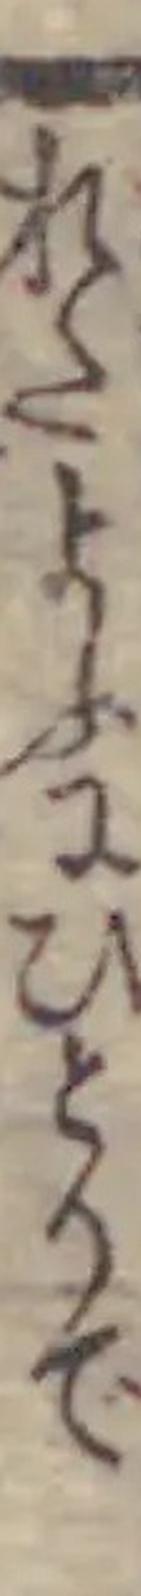れたよふにひとりで
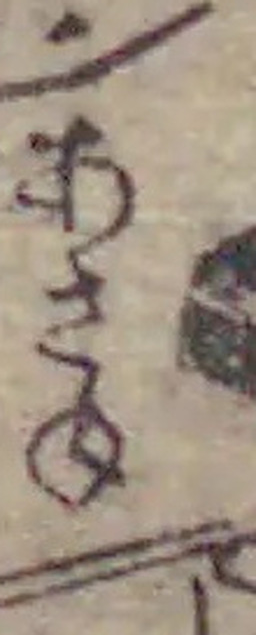あさね
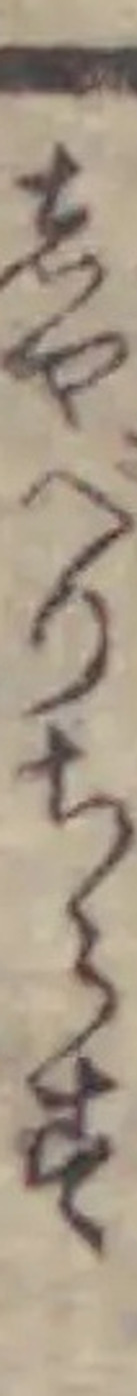しやべりちらす
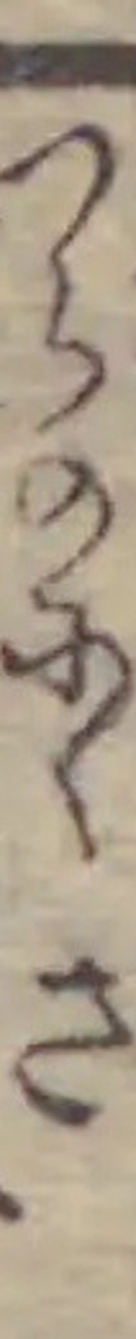つらのにくさ
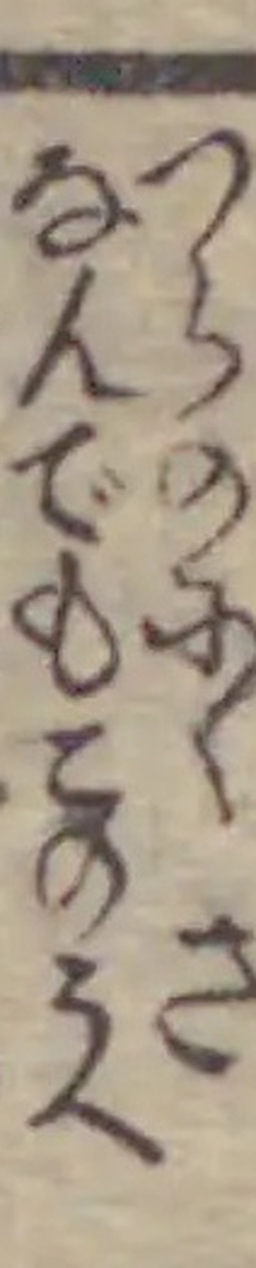なんでもこのうへ
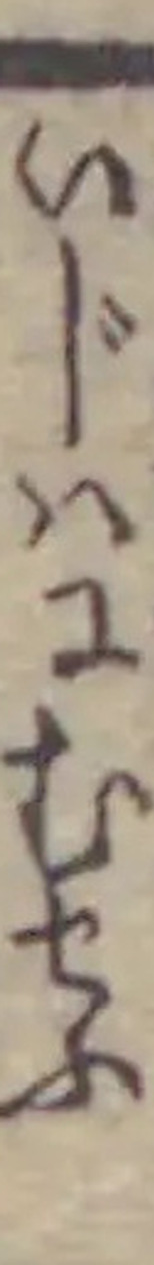いじはにむせふ
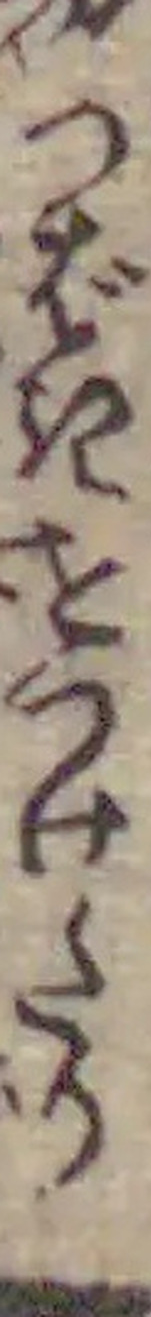つばきをつけたり
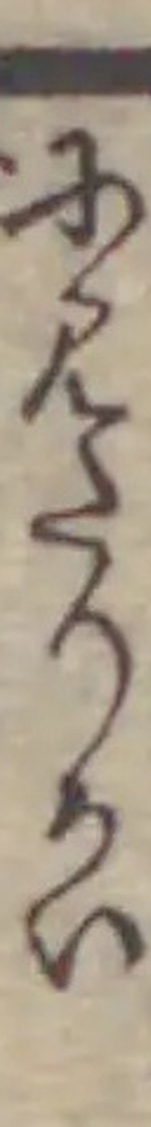に見たりかい
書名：腹内養生主論 3巻
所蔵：国立国会図書館 National Diet Library, JAPAN
